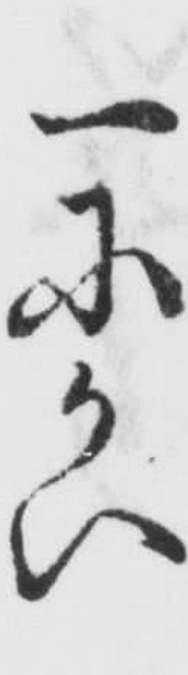一小かい
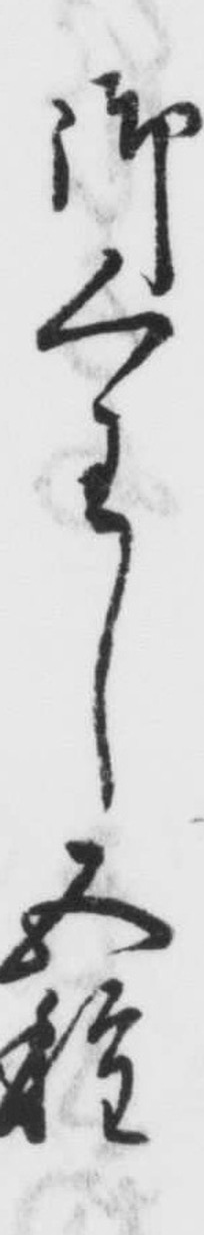御くわし五程
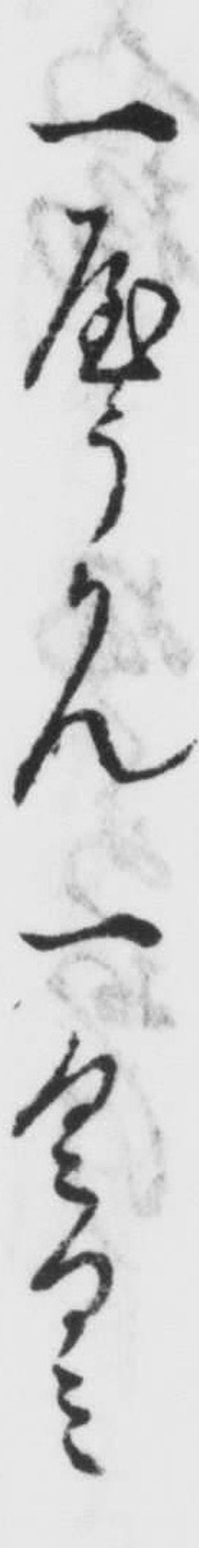一やうかん一くるミ
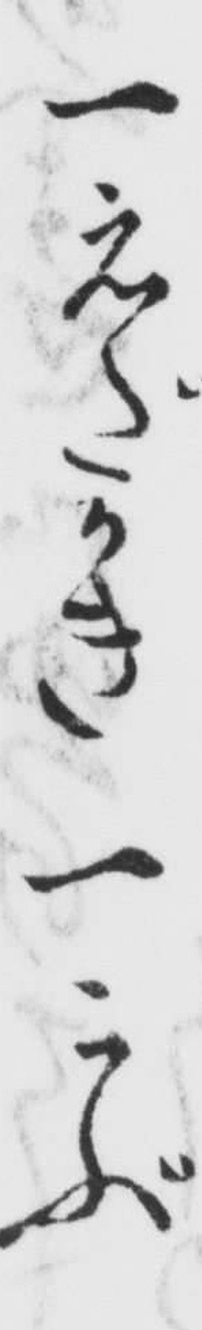一えだかき一こぶ
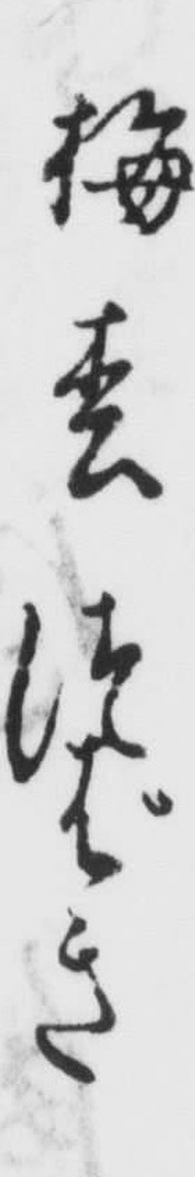梅枩つばき

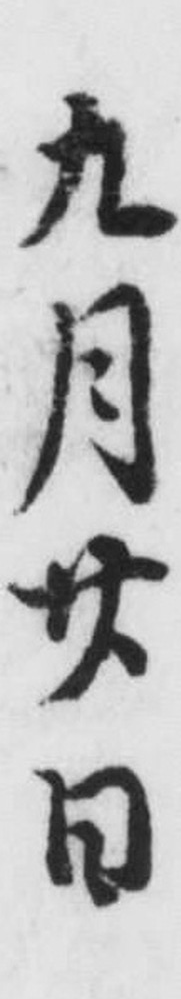九月廿日
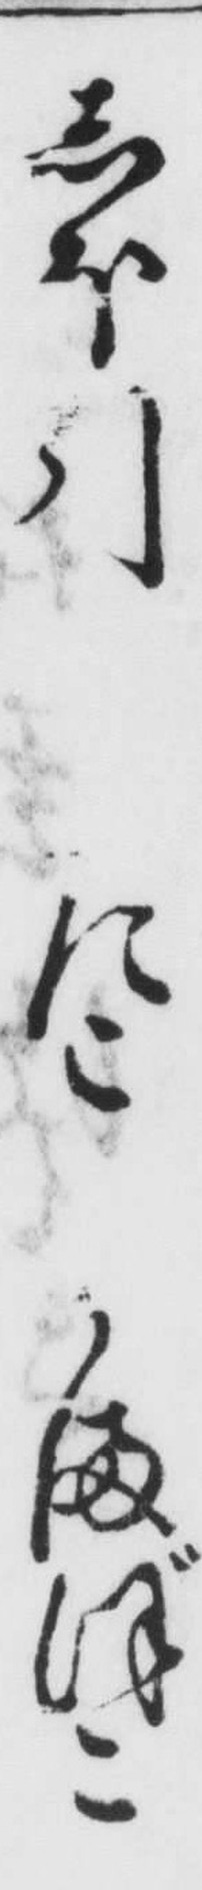しほ引たこかまぼこ
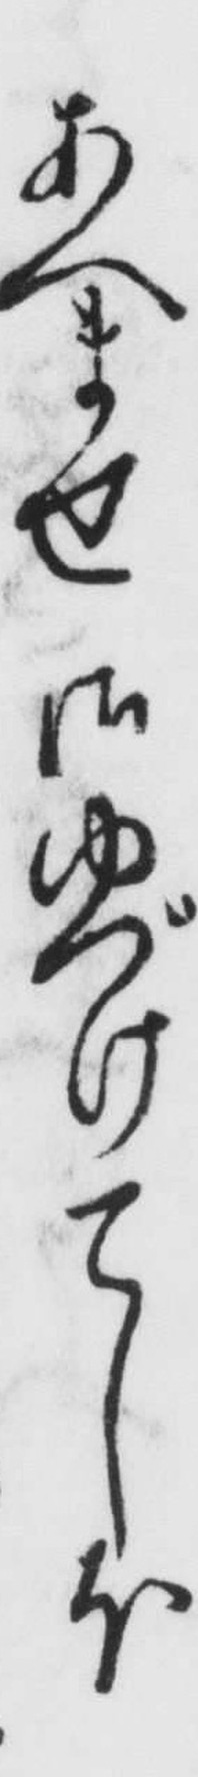あへませゆづけてしほ
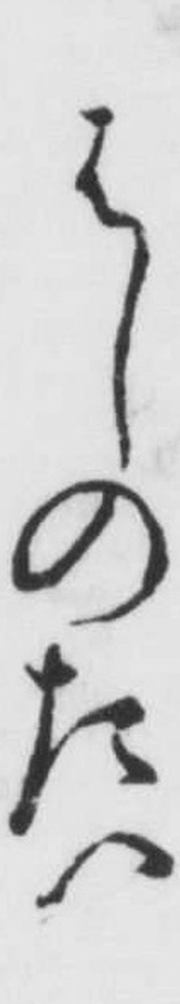はしのたハ
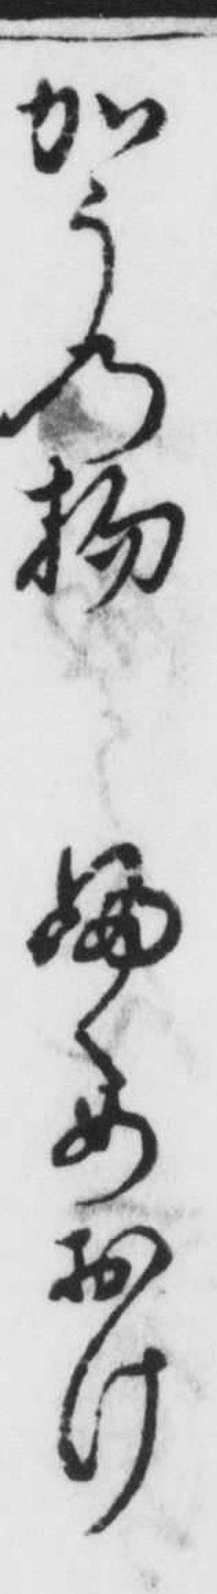かうの物ふくめおけ
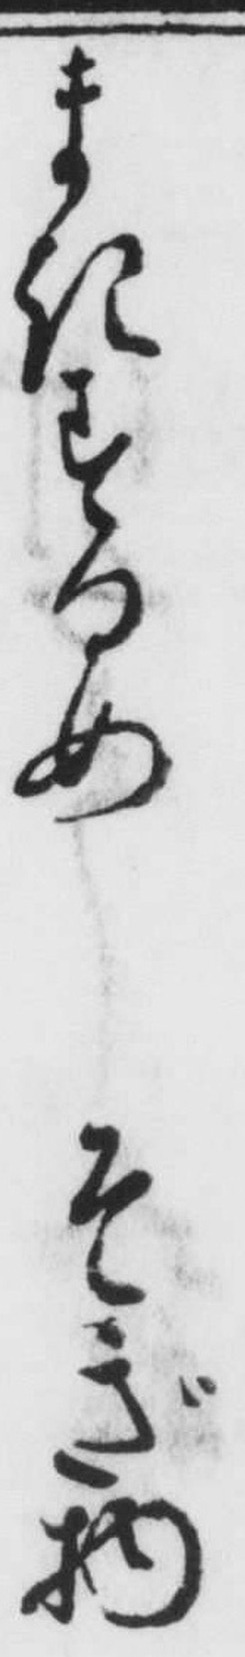まきするめそぎ物
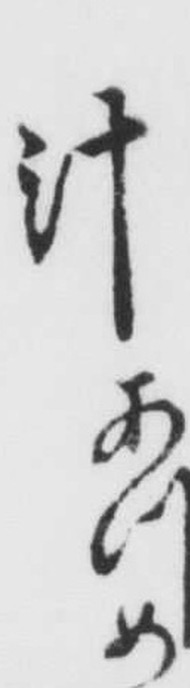汁あつめ
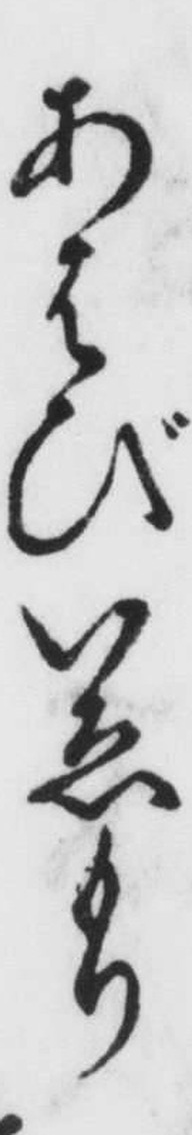あはひいゑもり
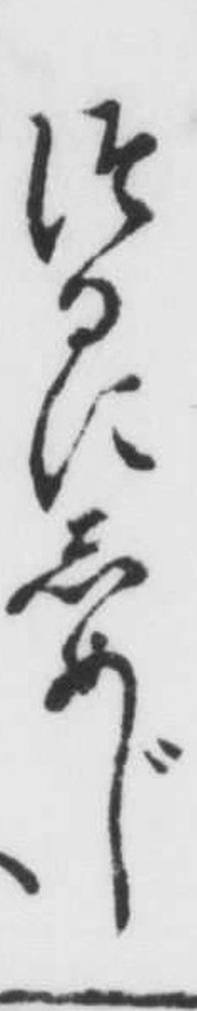つるにしめじ
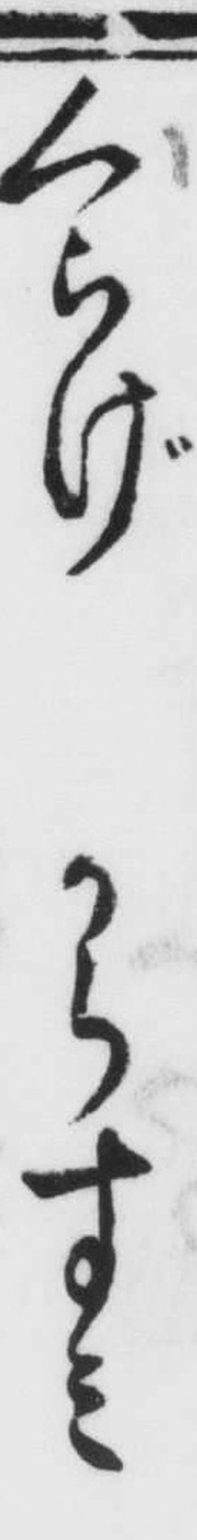くらげからすミ
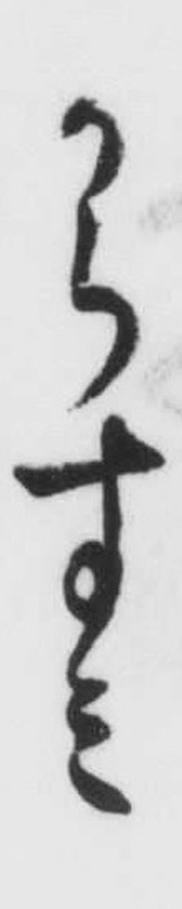からすミ
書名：料理切形秘伝抄
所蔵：大阪府立大学学術情報センター 国文学研究資料館
